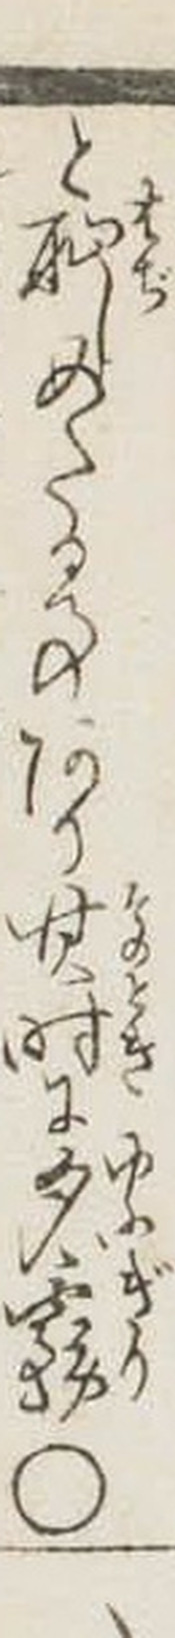と恥しめたる事あり其時に夕霧○
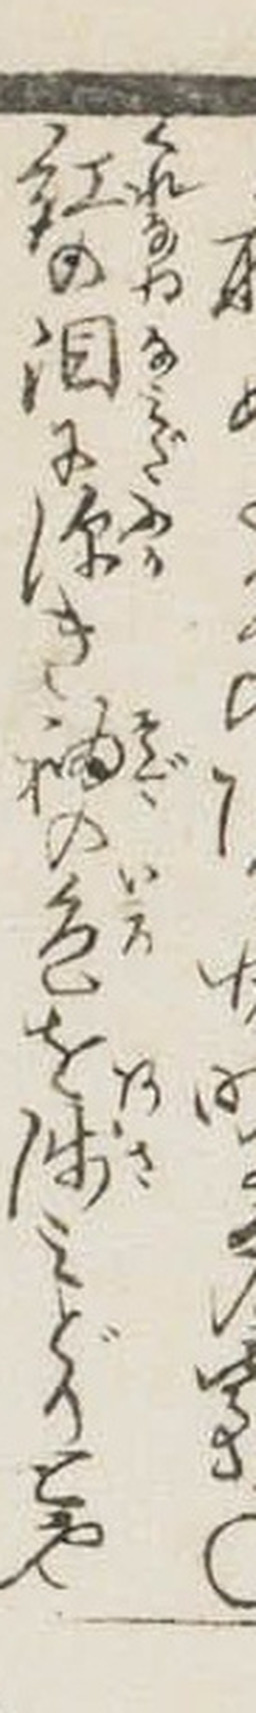紅の泪に深き袖の色を浅みどりとや
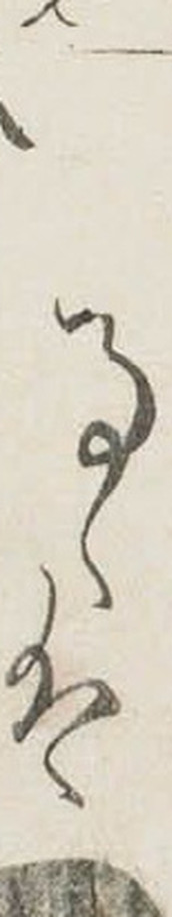るゝは
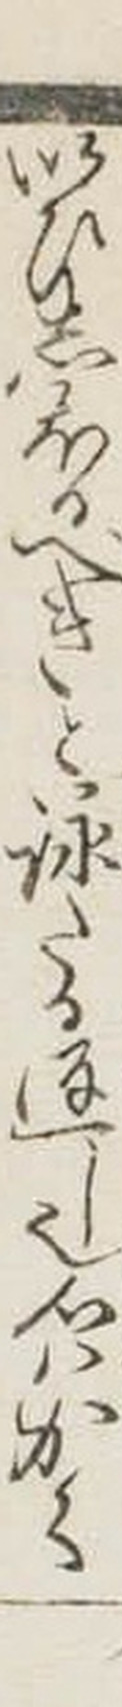いひしほるべきと詠たる返し也心はかく
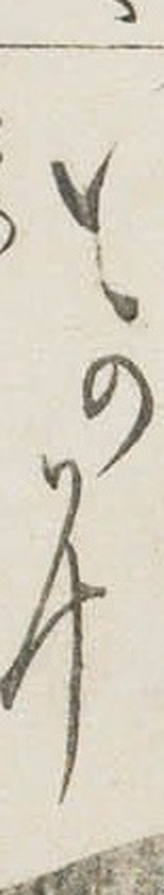いかに
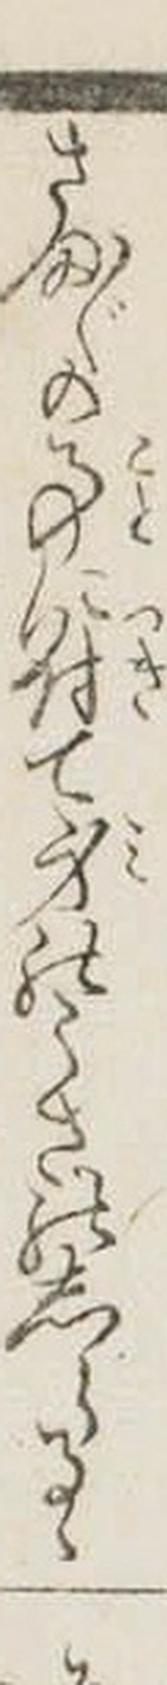さま〴〵の事に付て身のうさのしらるゝ
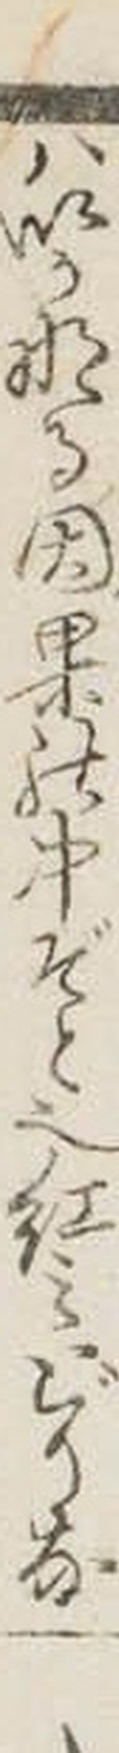はいかなる因果の中ぞと也紅みどりな
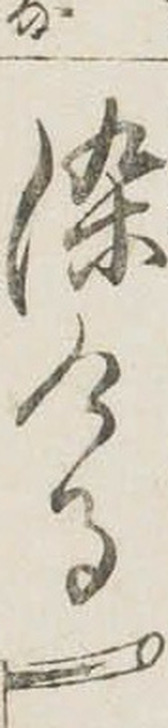染ける
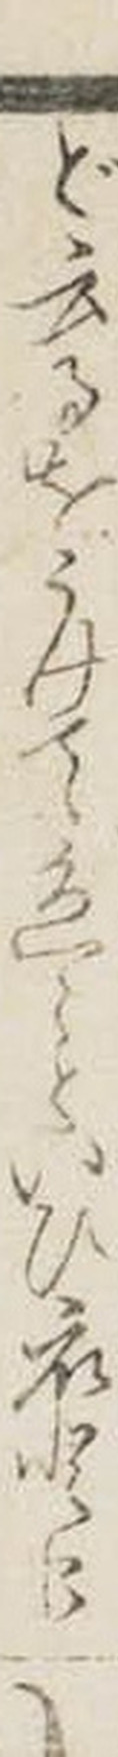ど云るをうけて色々といひ衣とも
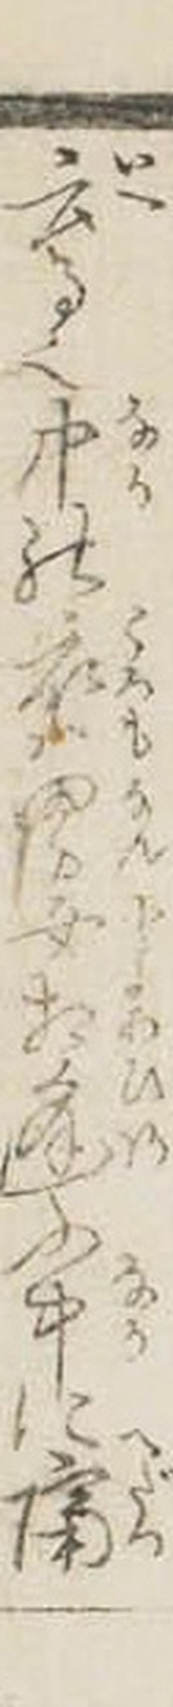云る也中の衣は男女相逢ふ中に隔
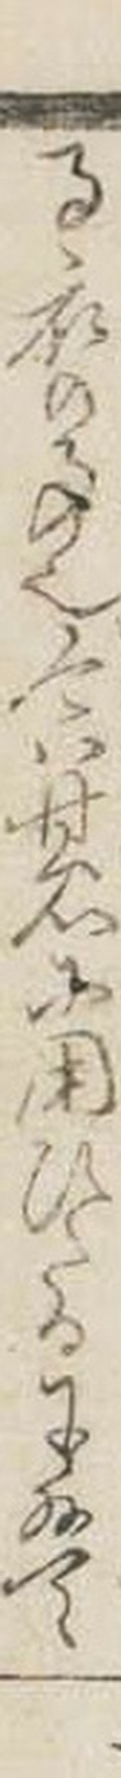る衣の事也今は其心に用ひたるには
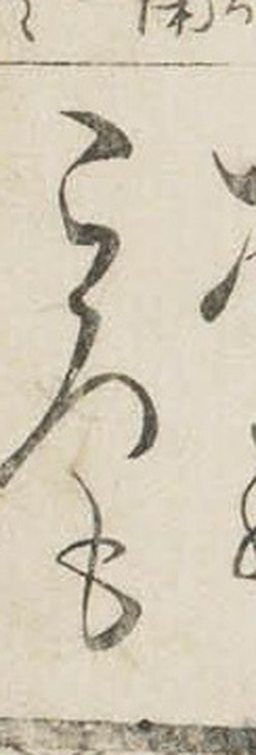ころも
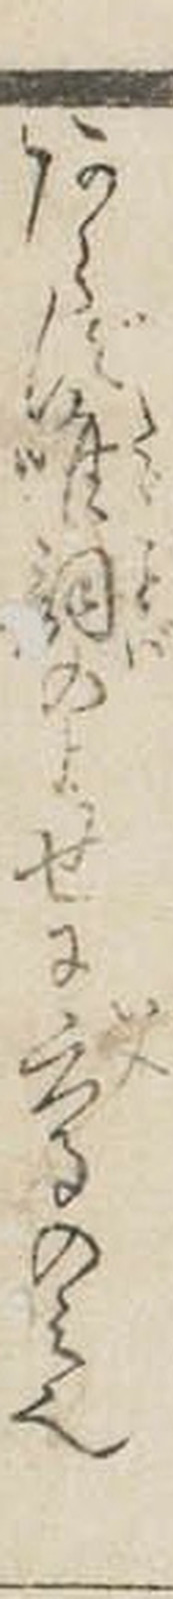あらず唯詞のよせに云るのみ也

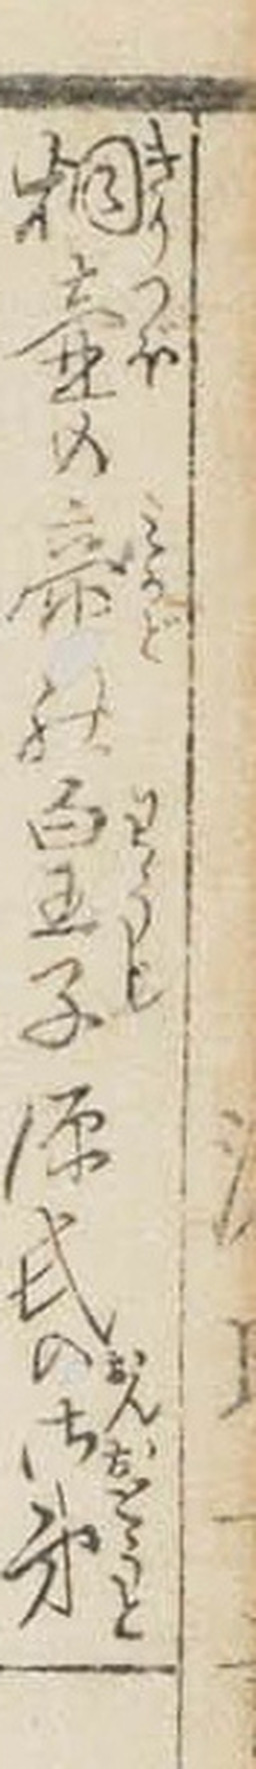桐壺の帝の皇子源氏の御弟
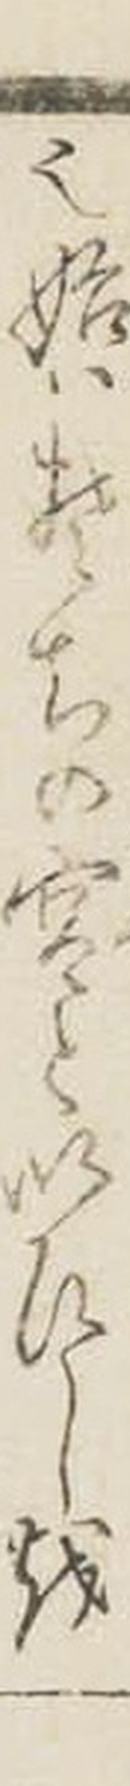也始はそちの宮といひしを
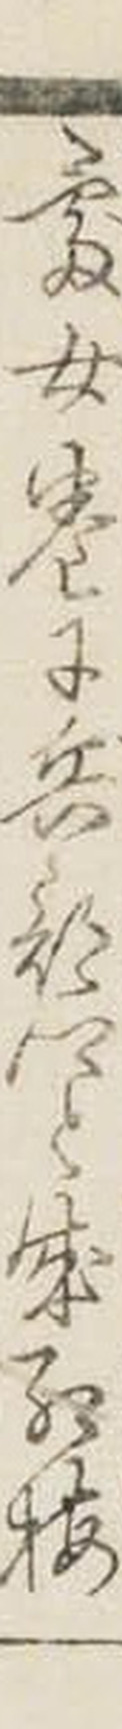処女巻に兵部卿と成紅梅
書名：源氏百人一首
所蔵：東京学芸大学教育コンテンツアーカイブ
